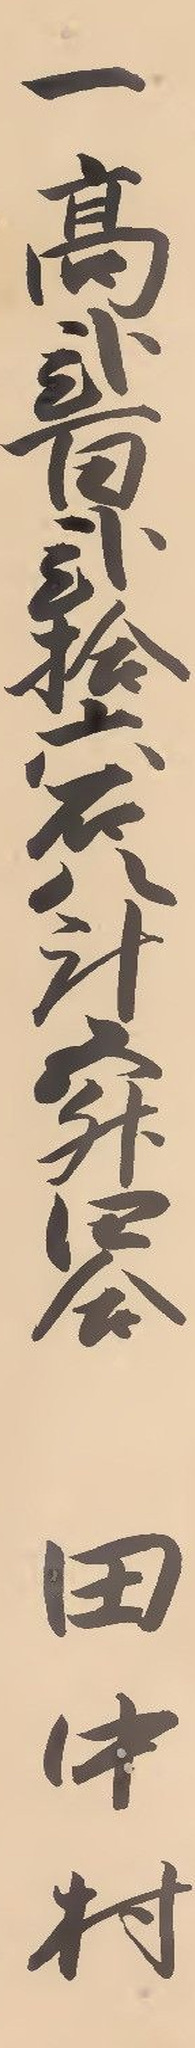一高弐百弐拾六石八斗五升四合田中村
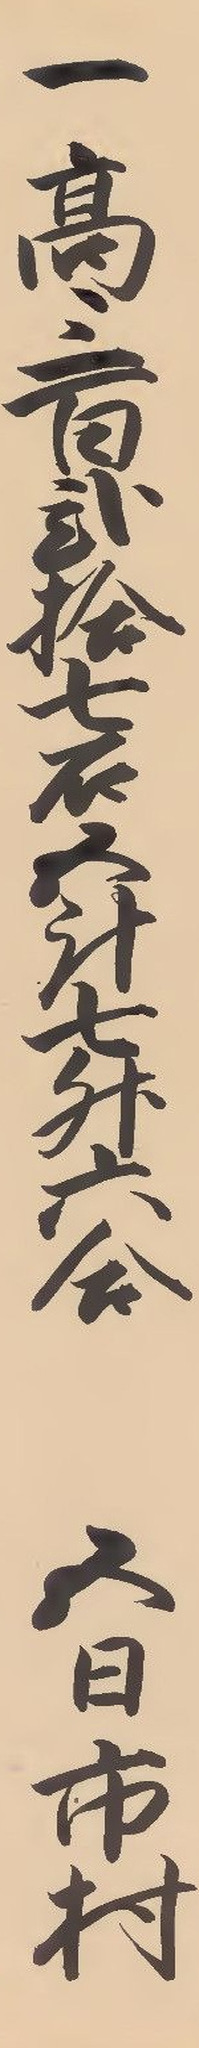一高三百弐拾七石五斗七升六合五日市村
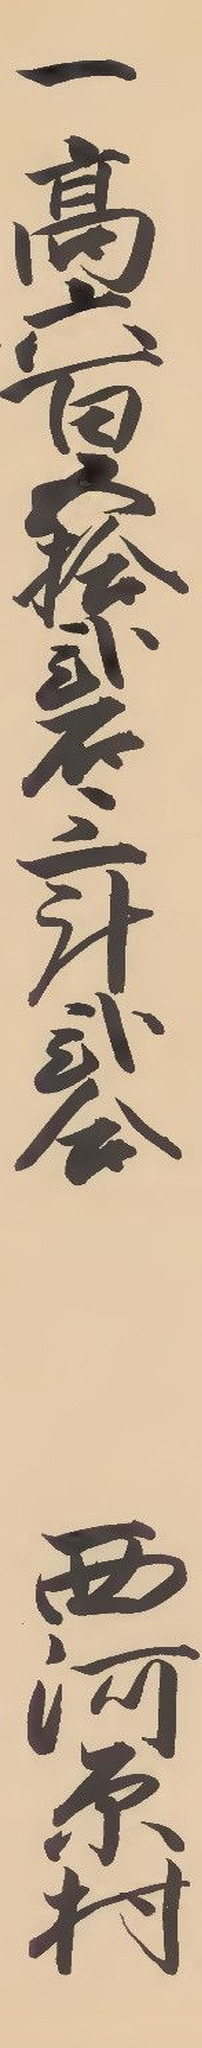一高六百五拾弐石三斗弐合西河原村
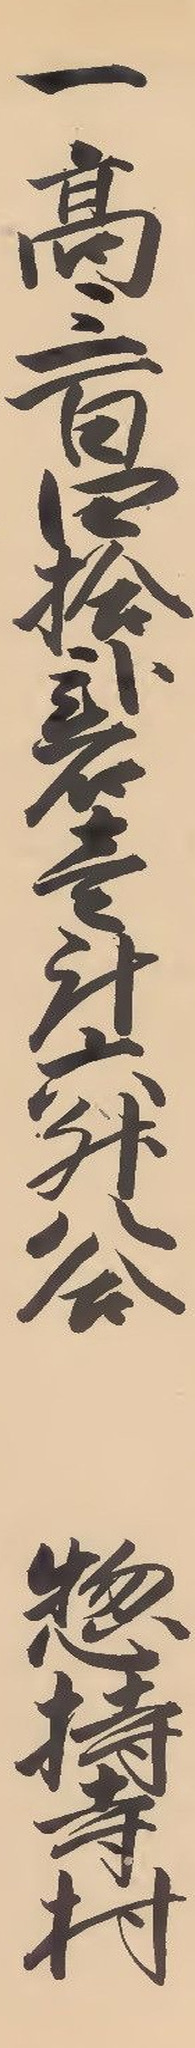一高三百四拾弐石壱斗六升八合惣持寺村

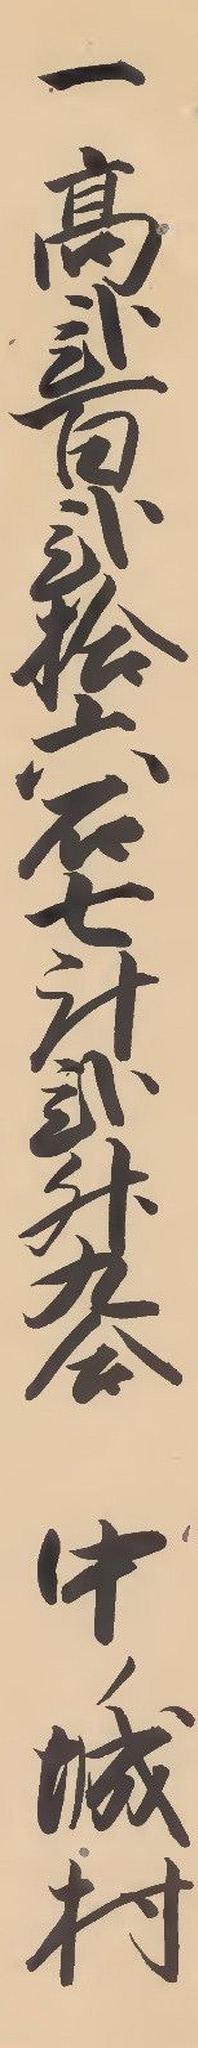一高弐百弐拾六石七斗弐升九合中ノ城村
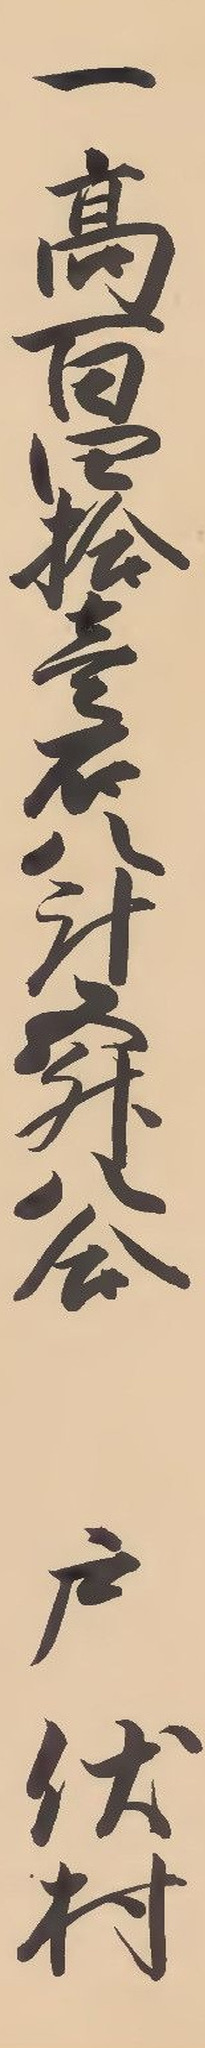一高百四拾壱石八斗五升八合戸伏村
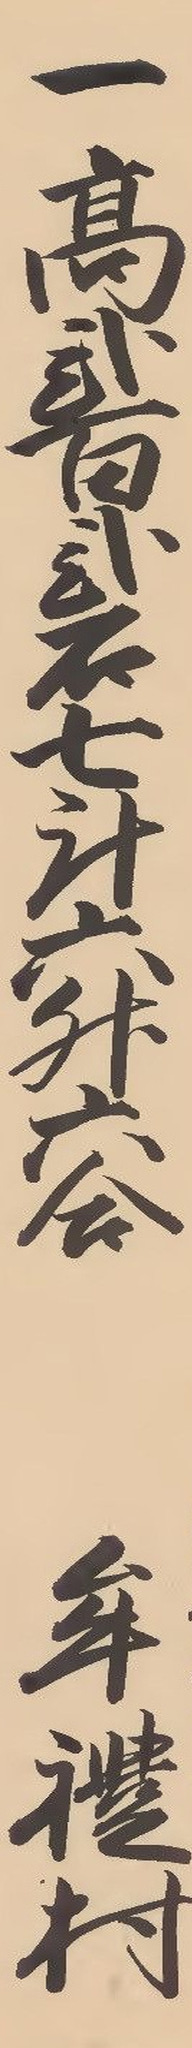一高弐百弐石七斗六升六合牟礼村
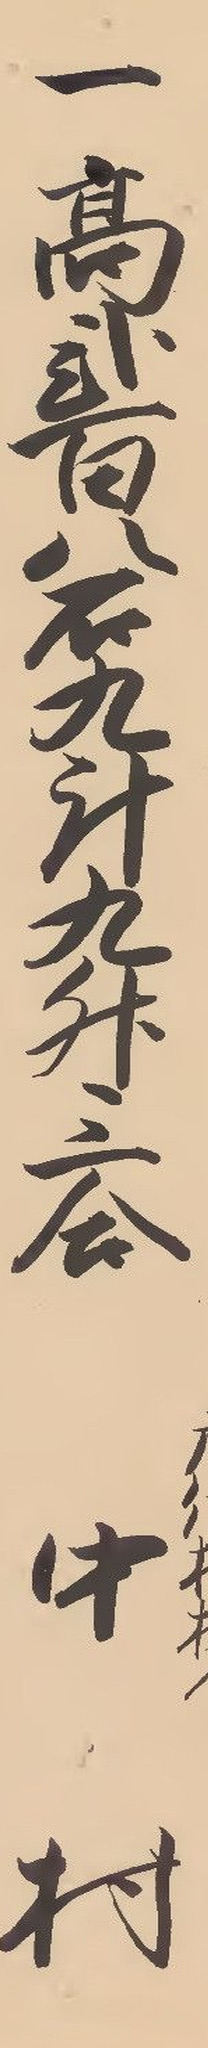一高弐百八石九斗九升三合中村
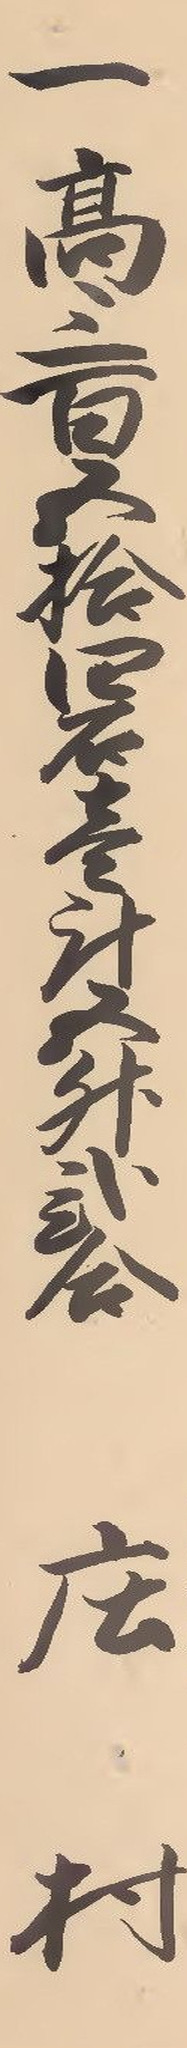一高三百五拾四石壱斗五升弐合庄村
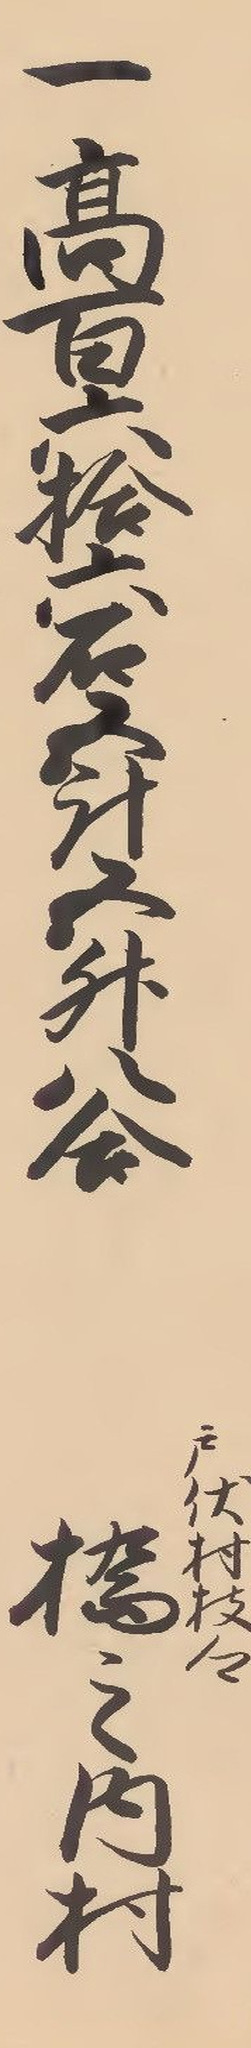一高百六拾六石五斗五升八合橋之内村
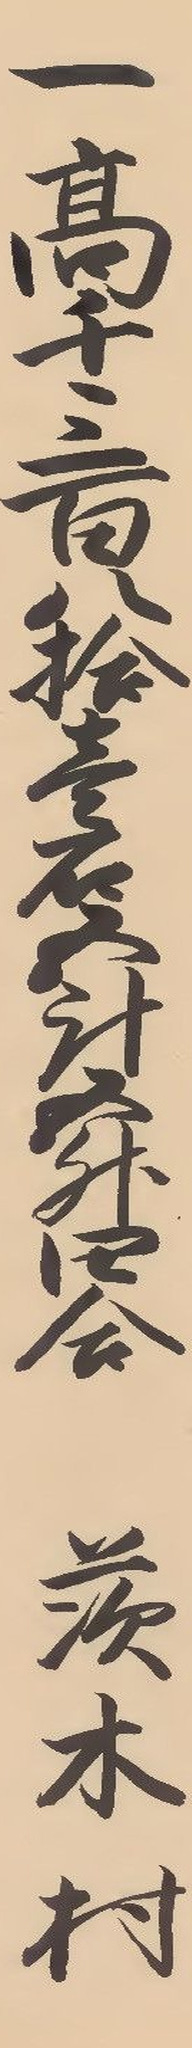一高千三百八拾壱石五斗五升四合茨木村
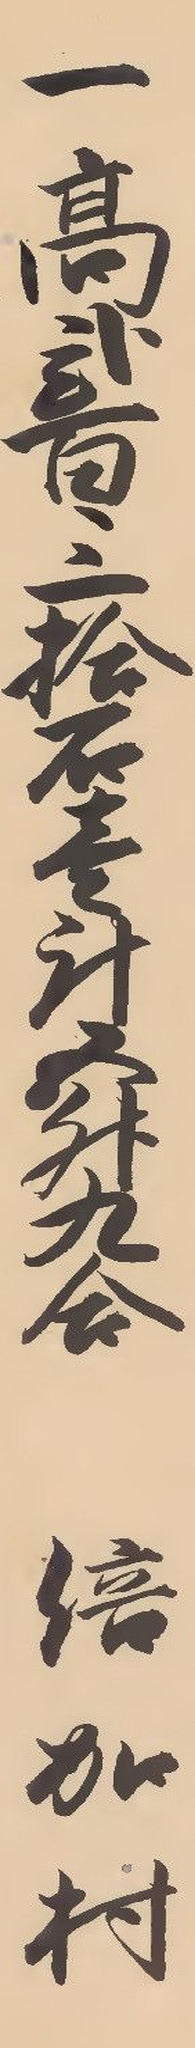一高弐百三拾石壱斗五升九合倍加村

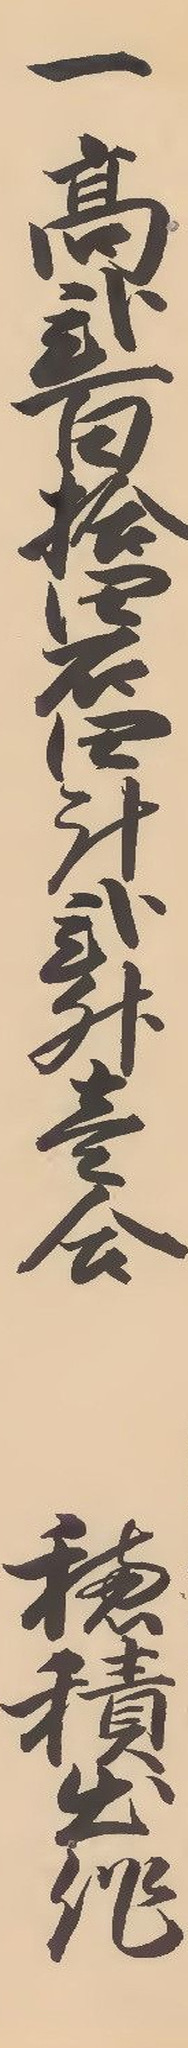一高弐百拾四石四斗弐升壱合穂積出作
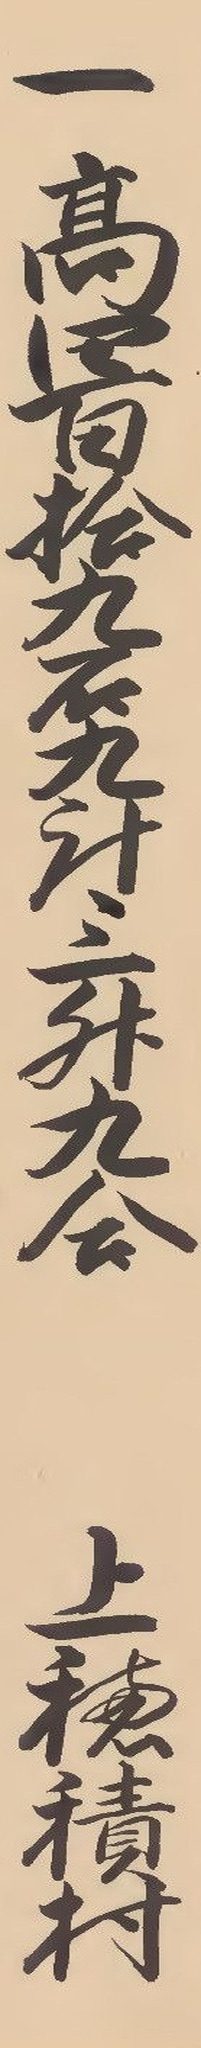一高四百拾九石九斗三升九合上穂積村
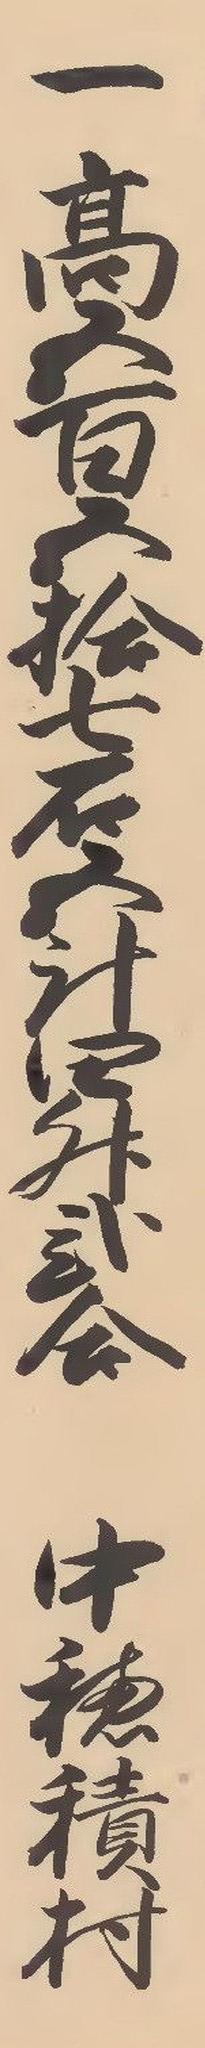一高五百五拾七石五斗四升弐合中穂積村
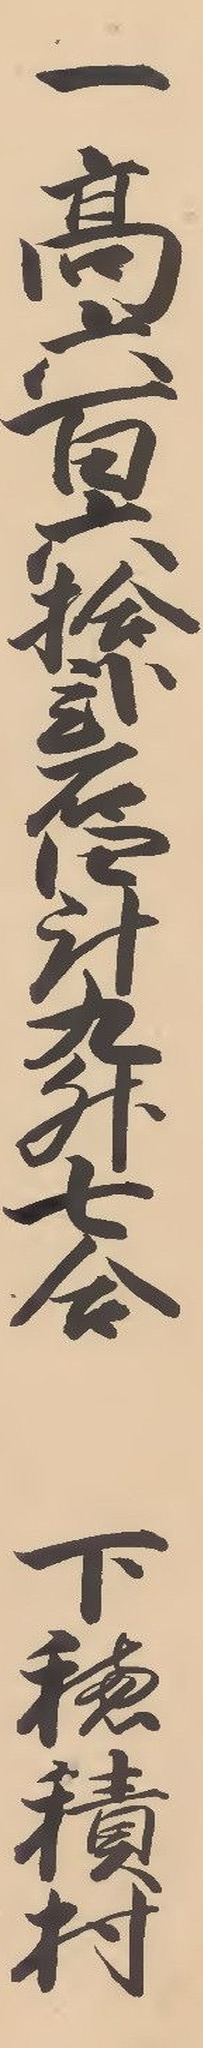一高六百六拾弐石四斗九升七合下穂積村
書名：摂津国郷帳
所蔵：国立公文書館 National Archives of Japan
